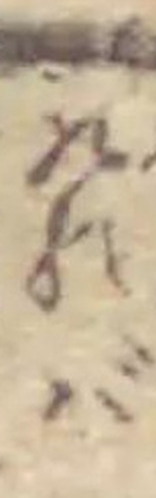ければ
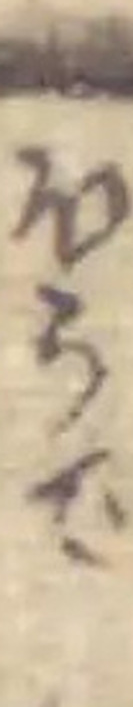ほうで
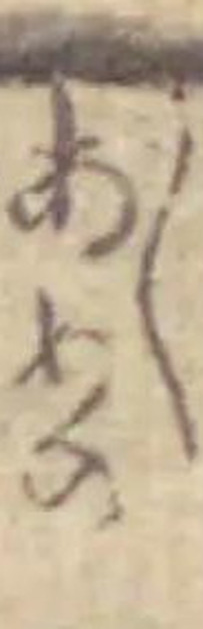あめの
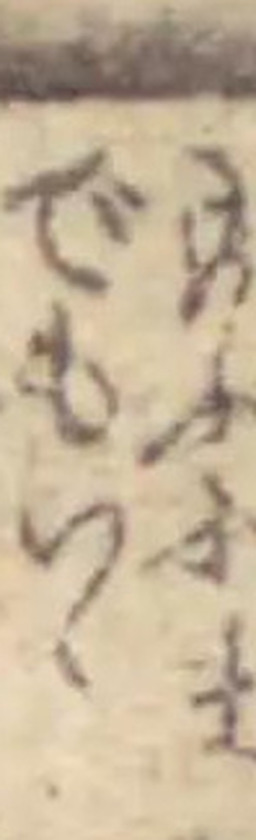でもいく
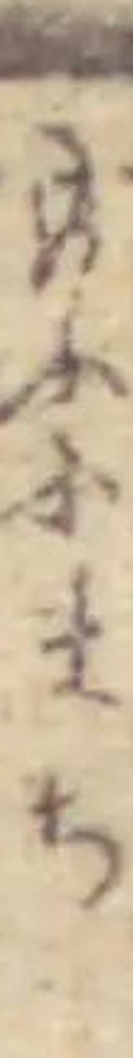もふ小まち
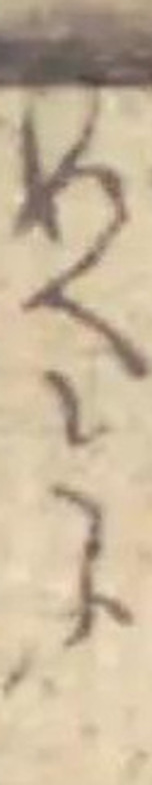めへとふ
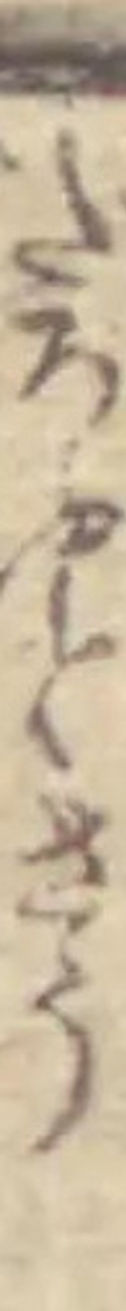だろふとさう
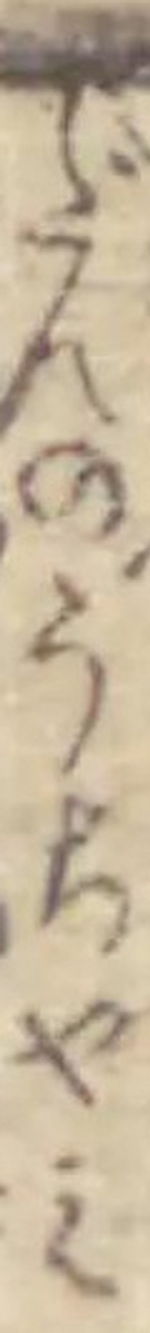だんのうちやみ
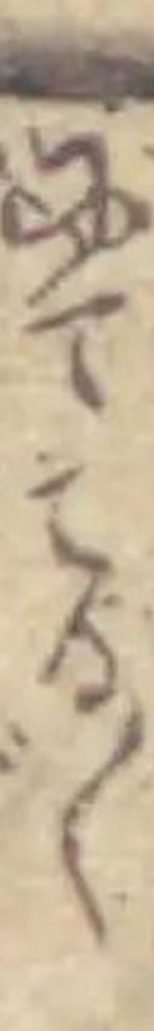にててる〳〵
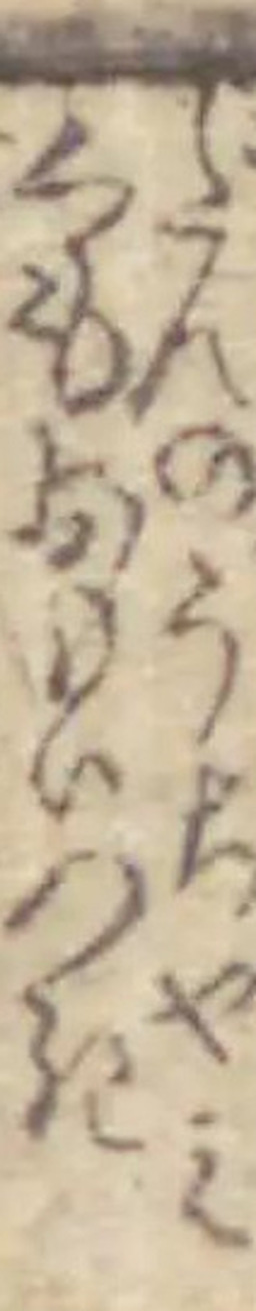くもおもいつき
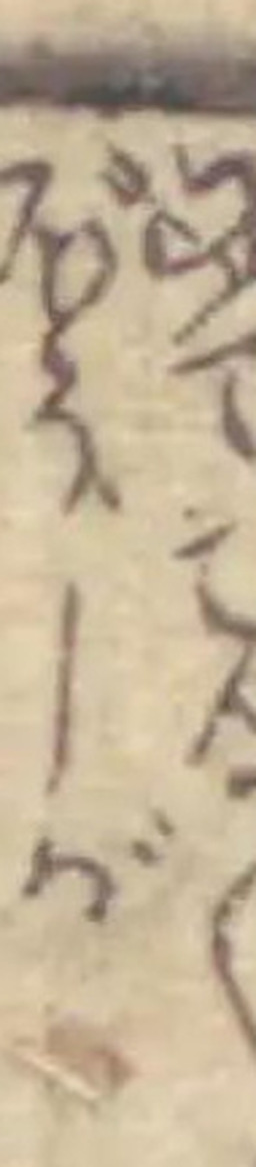ぼうしが
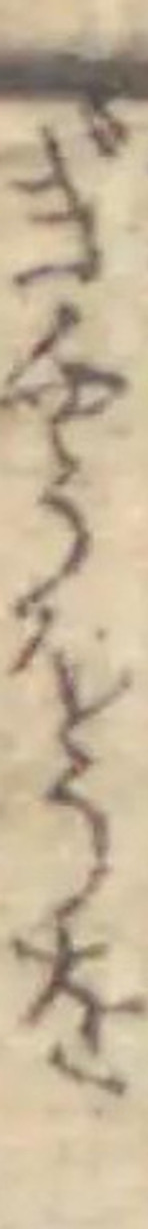ぎやうほうを
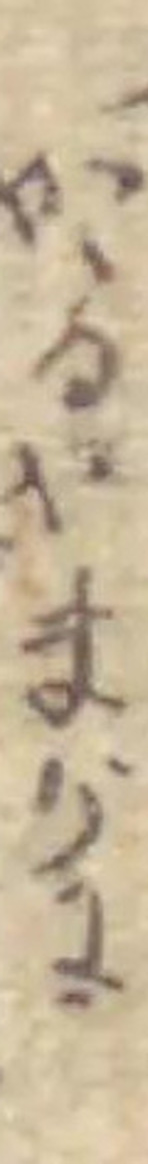〽かゝるやまがに
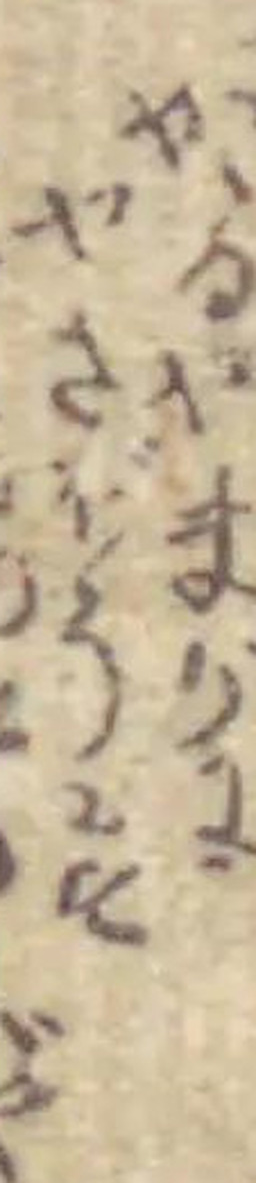やさぼうず
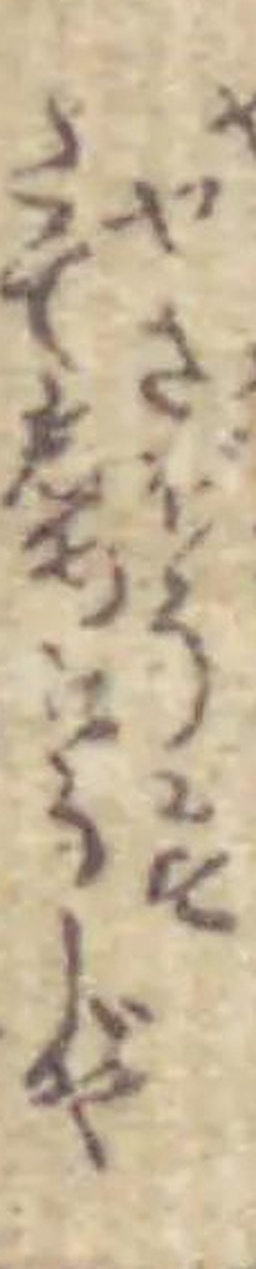さてしゆけうじや
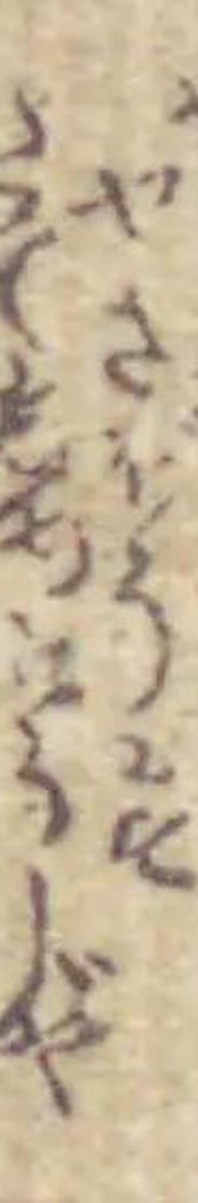さてしゆけうじや
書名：雨宮風宮出儘略縁記 3巻
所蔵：国立国会図書館 National Diet Library, JAPAN
